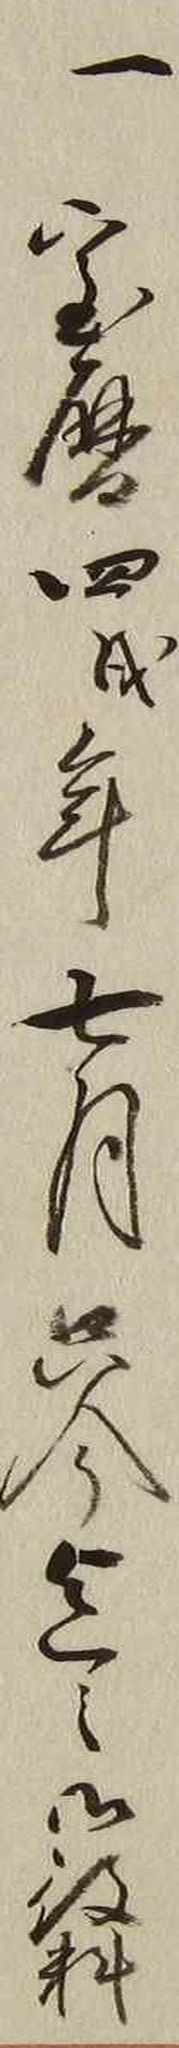一宝暦四戌年七月只今迄之御役料
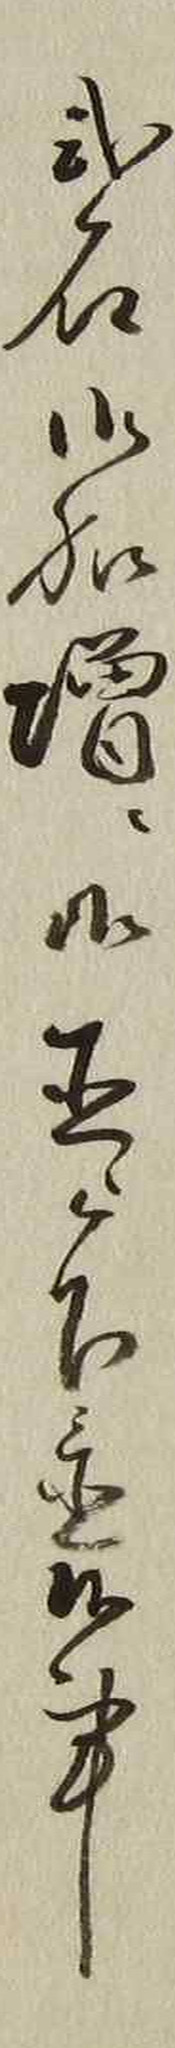弐石御加増ニ御直被下置候事
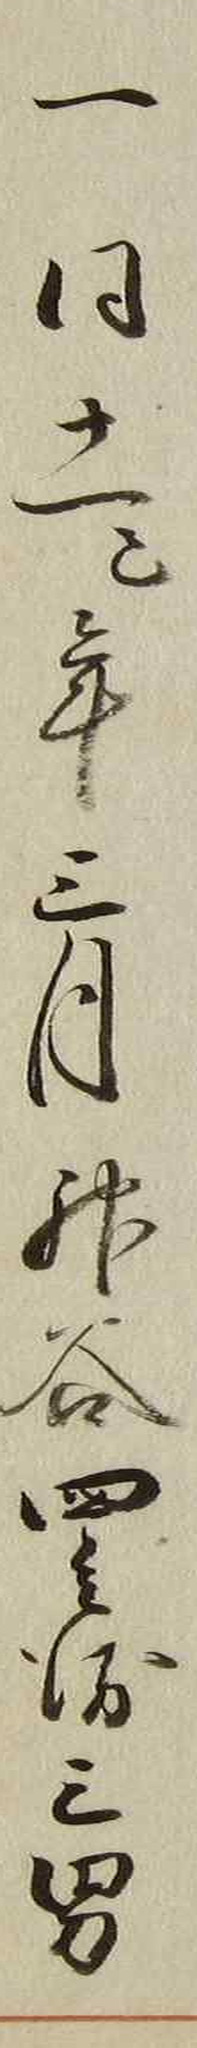一同十一巳年三月神谷四兵衛三男
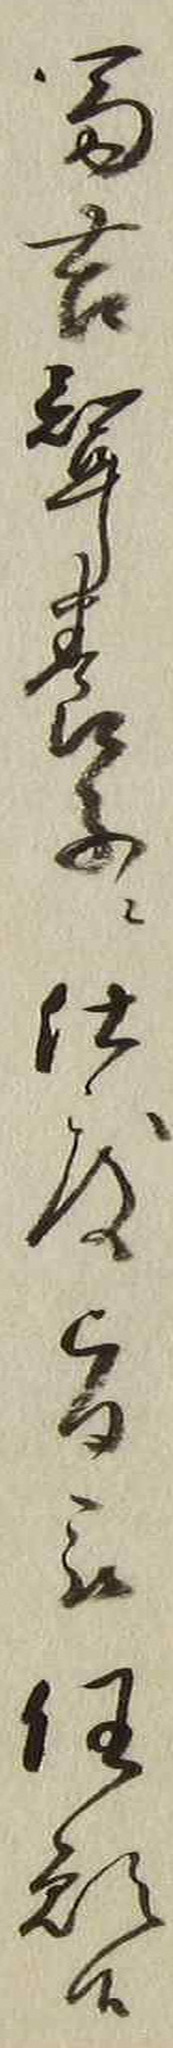富吉婿養子ニ仕度旨被任願候
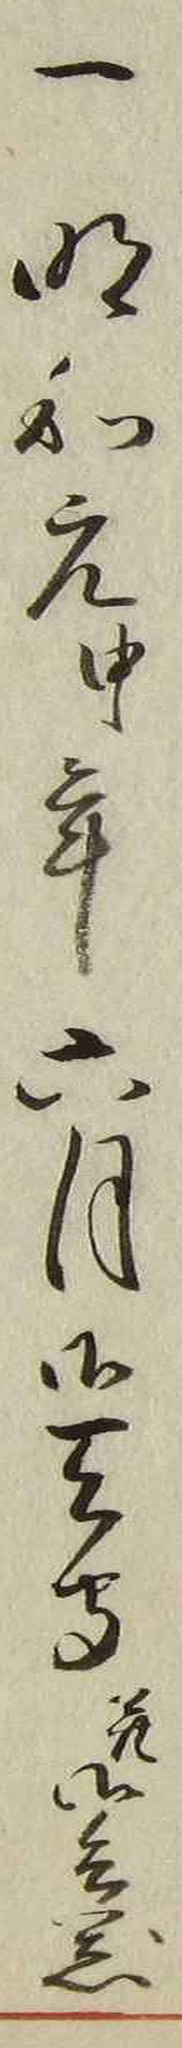一明和元申年六月御天守并御兵器
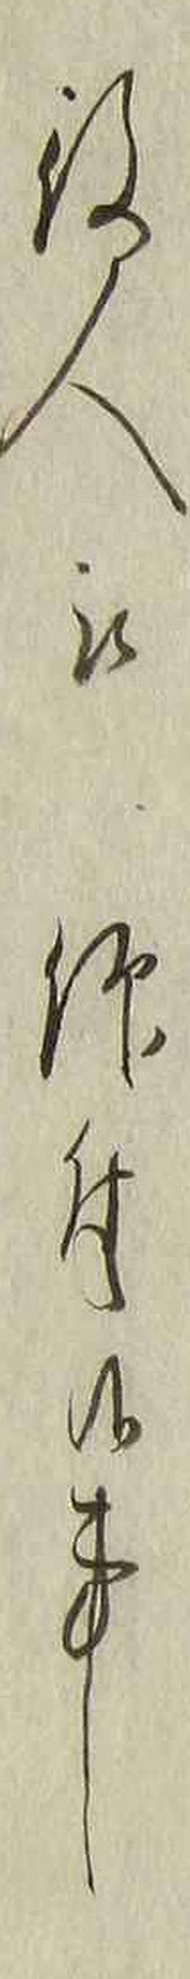役人被仰付候事

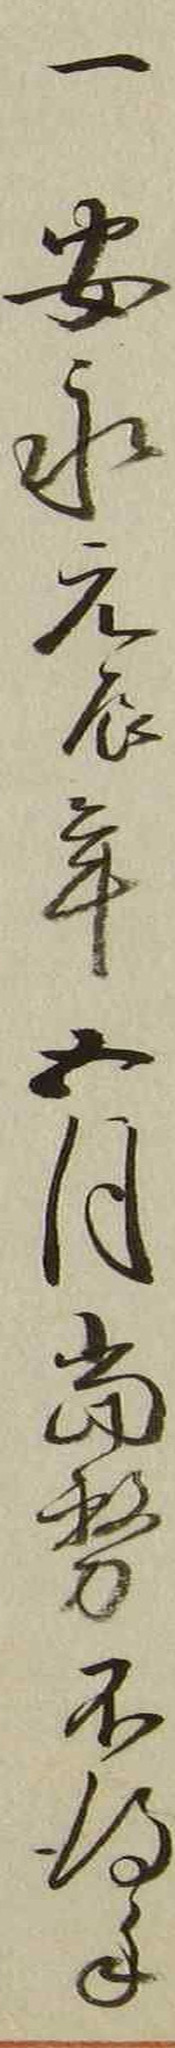一安永元辰年五月当務不得手
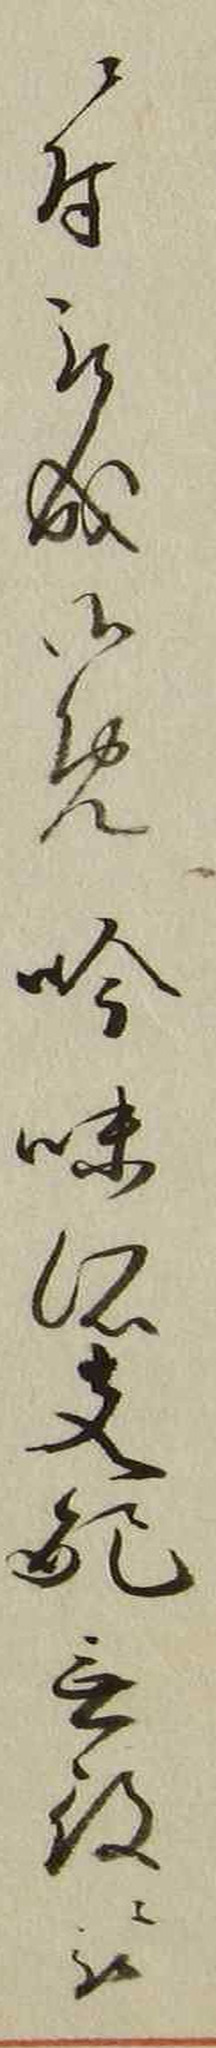ニ付被成御免吟味総支配無役ニ被
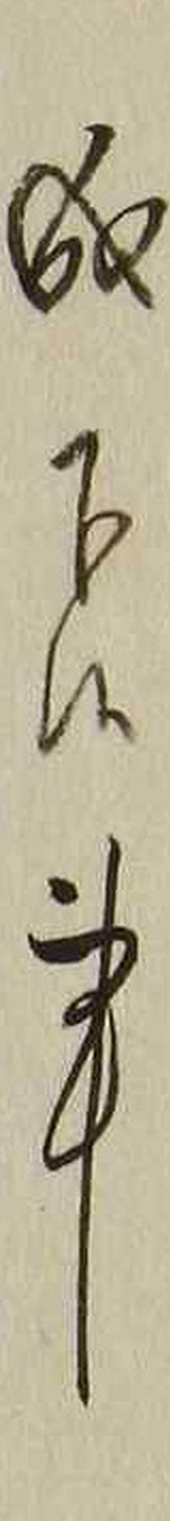成下候事
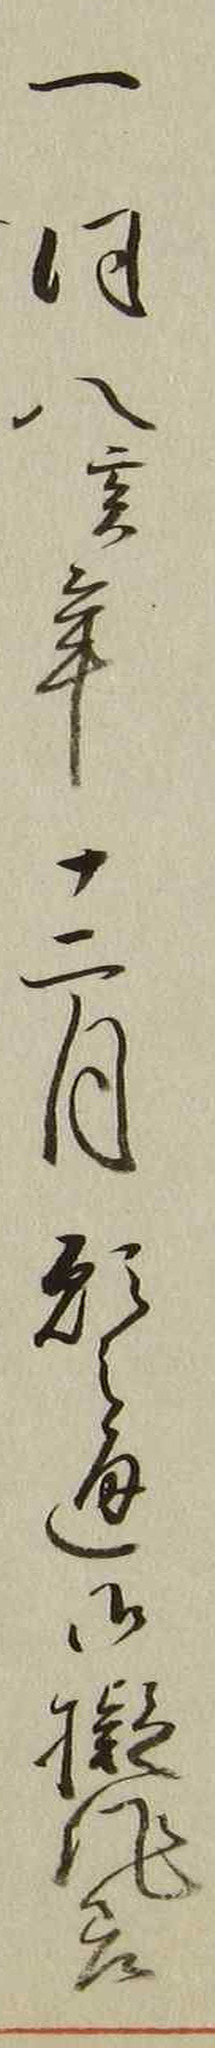一同八亥年十二月願之通御擬作差
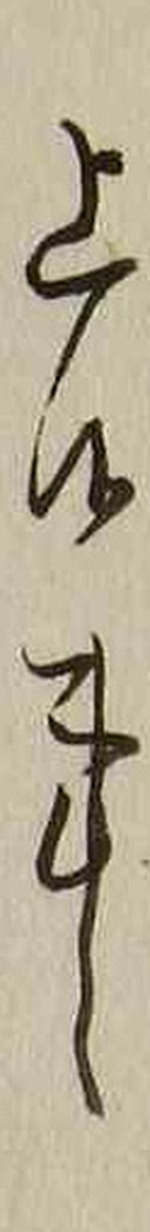上候事
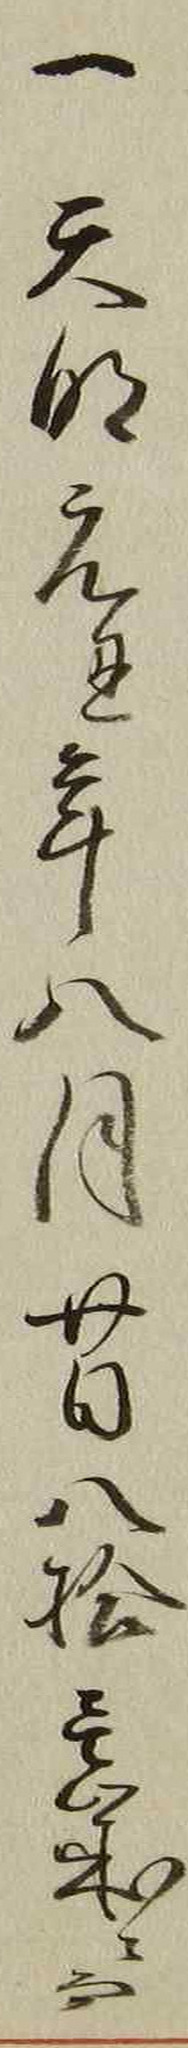一天明元丑年八月廿日八拾壱歳ニ而
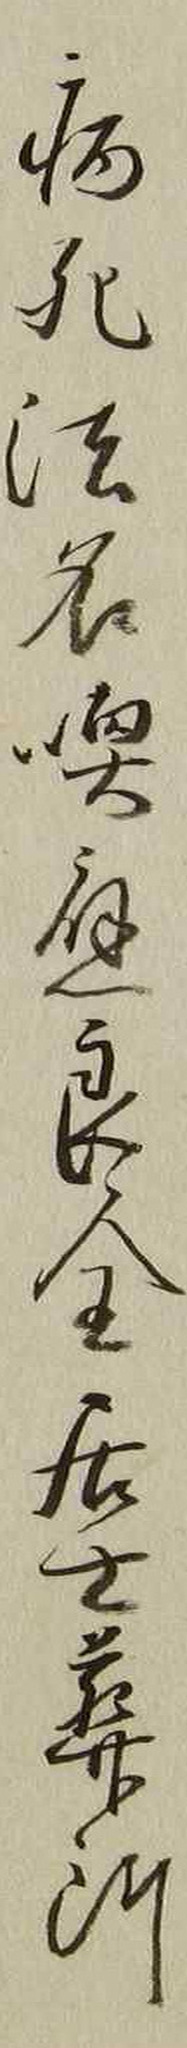病死法名喫応良全居士葬所
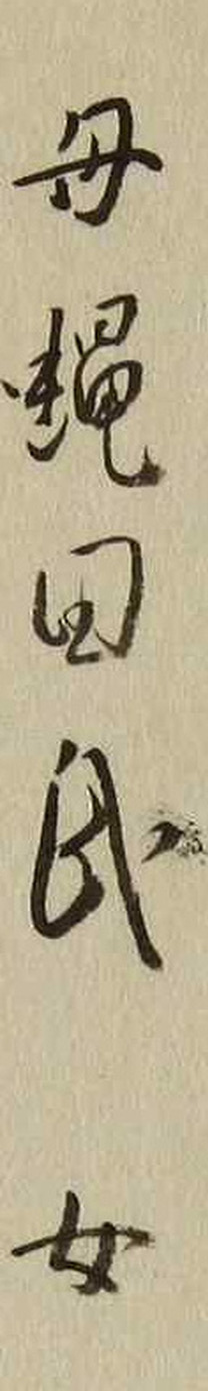母蝿田氏女
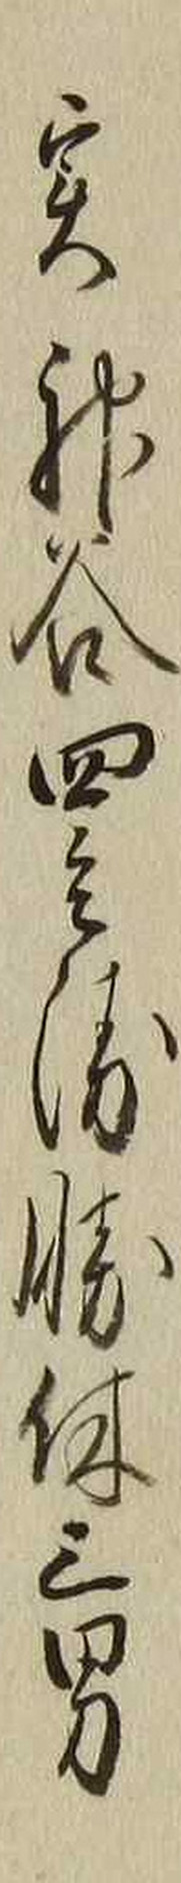実神谷四兵衛勝休三男
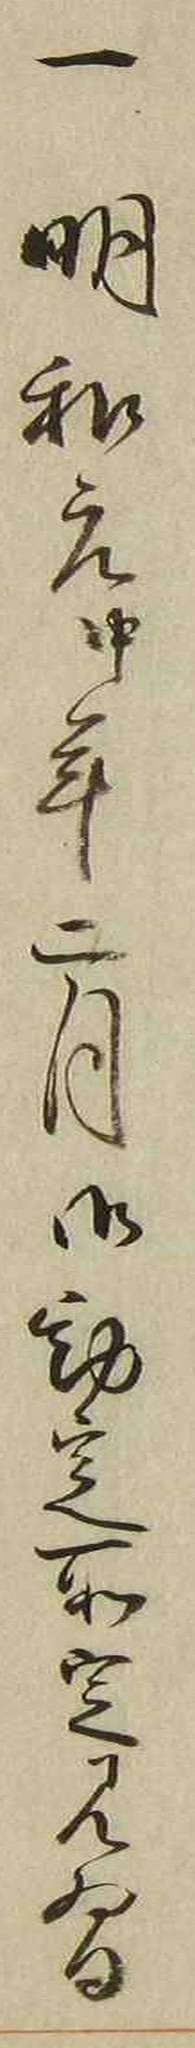一明和元申年二月御勘定所定見習
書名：諸士系譜　巻之32　い之部32
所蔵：会津若松市立会津図書館
